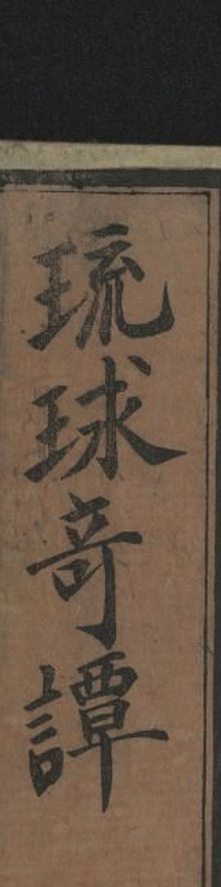琉球竒譚
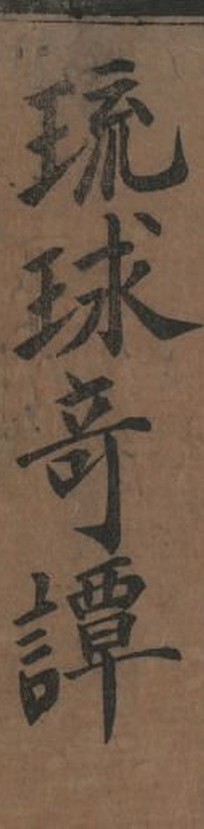琉球竒譚

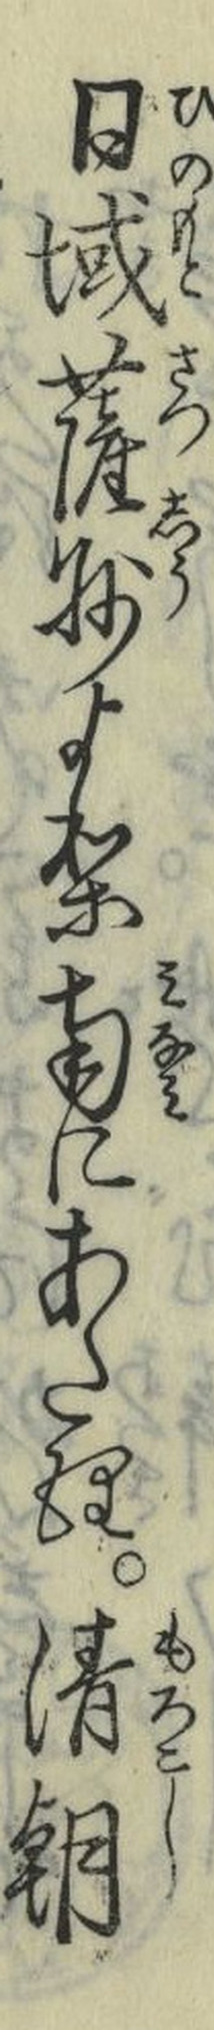日域薩州より南にあり。清朝
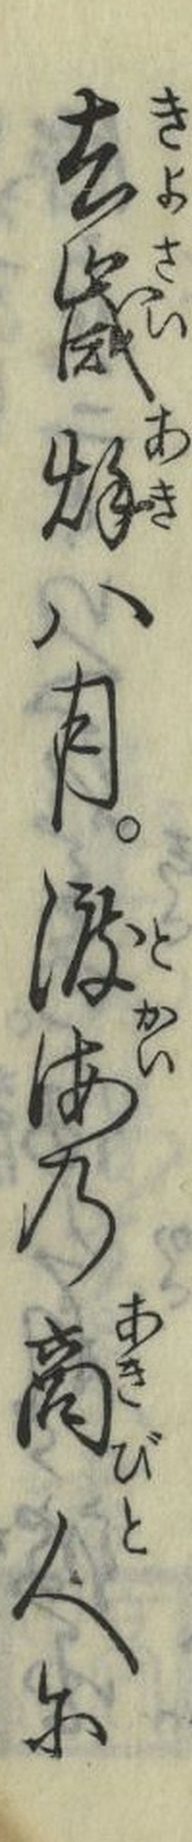去歳秌八月。渡海の商人に

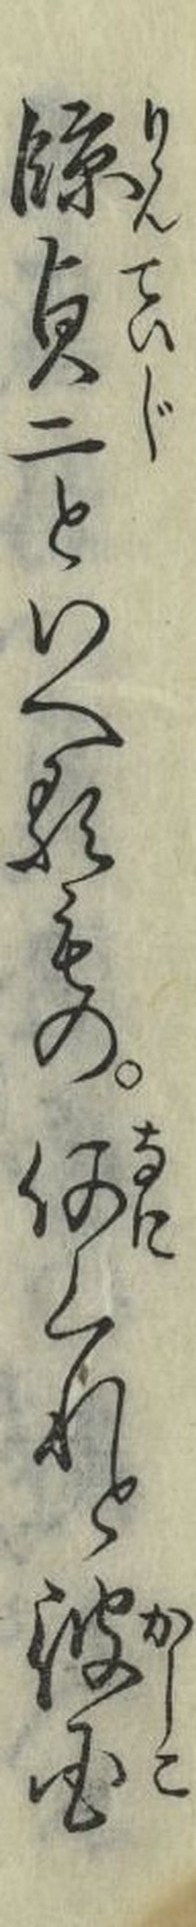臨貞二といへるもの。何くれと彼国
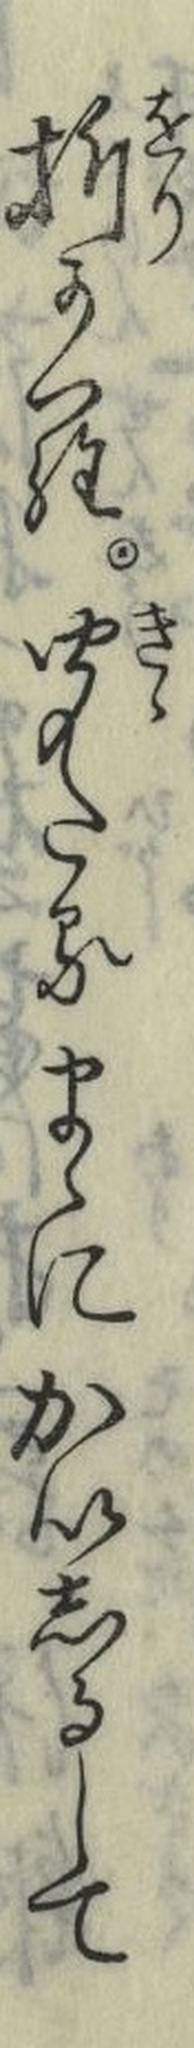折から。聞たるまゝにかいしるして
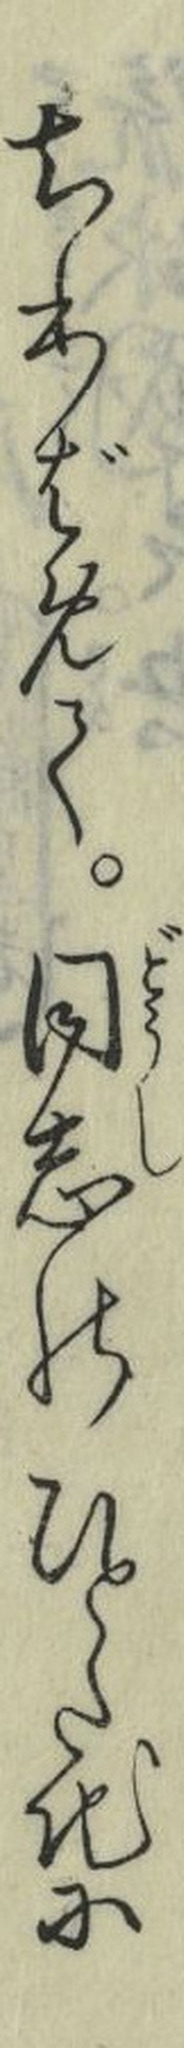ちりばめて。同志のひとたちに
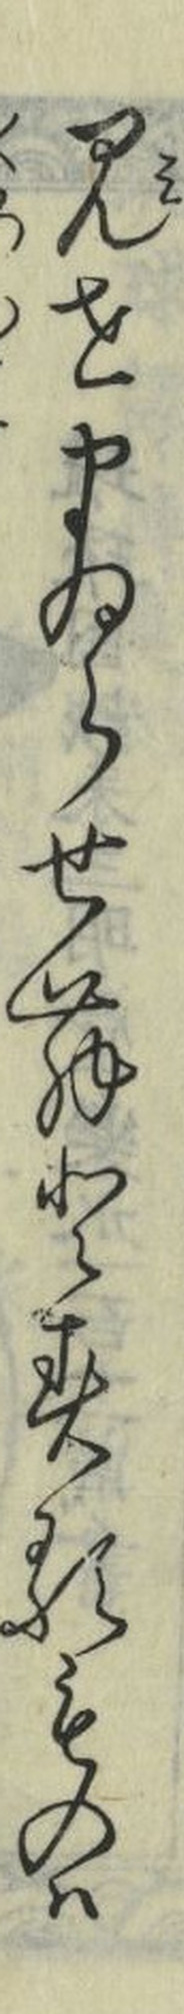見をまゐらせむとするものハ
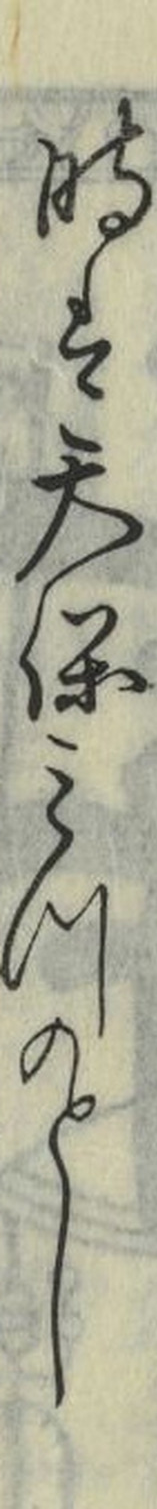時は天保ミつのとし
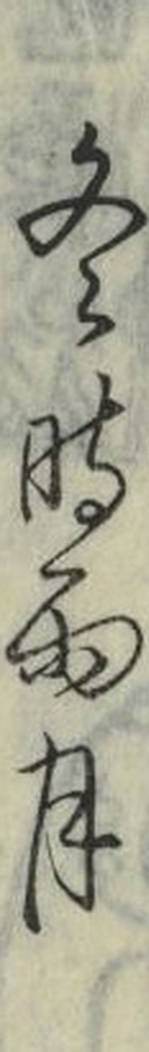冬時雨月
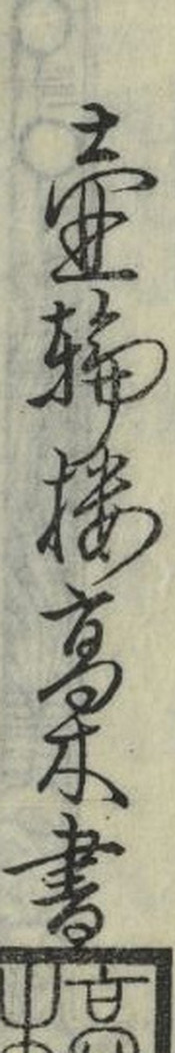壷輪楼高木書印

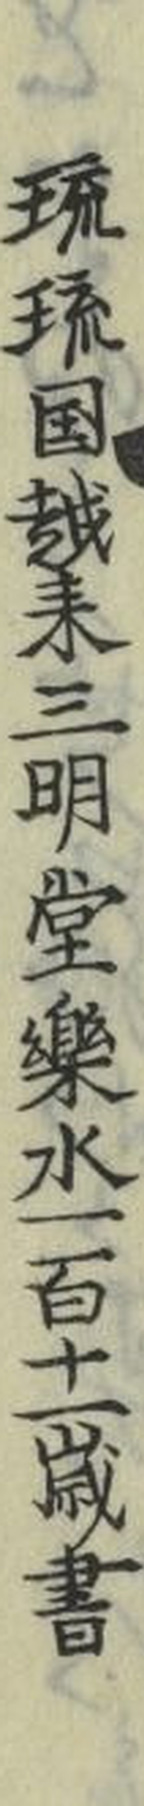琉球国越来三明堂樂水一百十一歳書
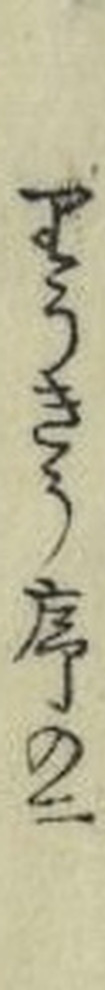りうきう序の二
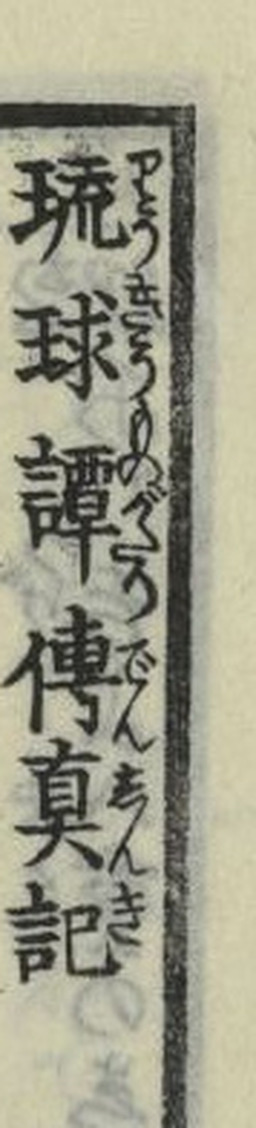琉球譚傳真記
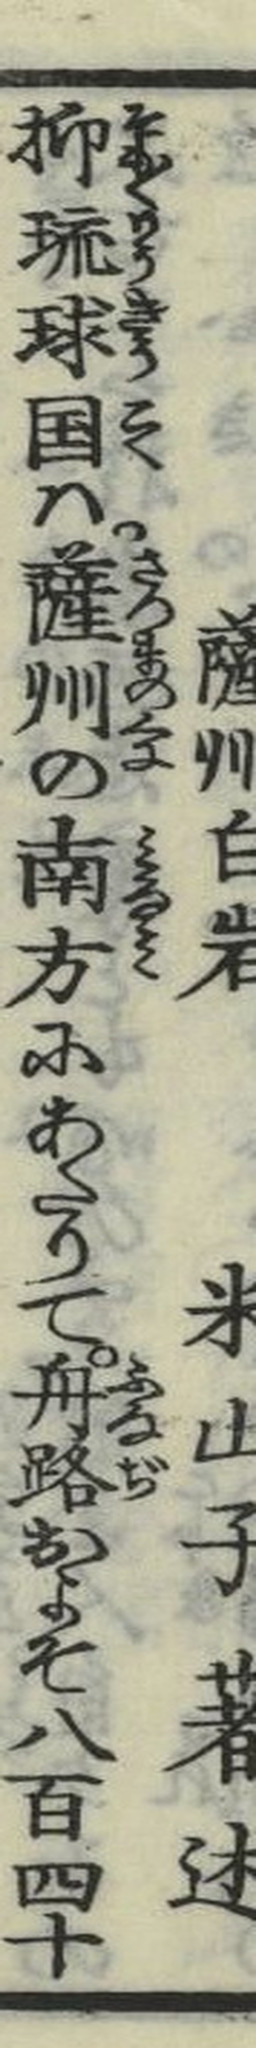抑琉球国ハ。薩州の南方にあたりて。舟路およそ八百四十

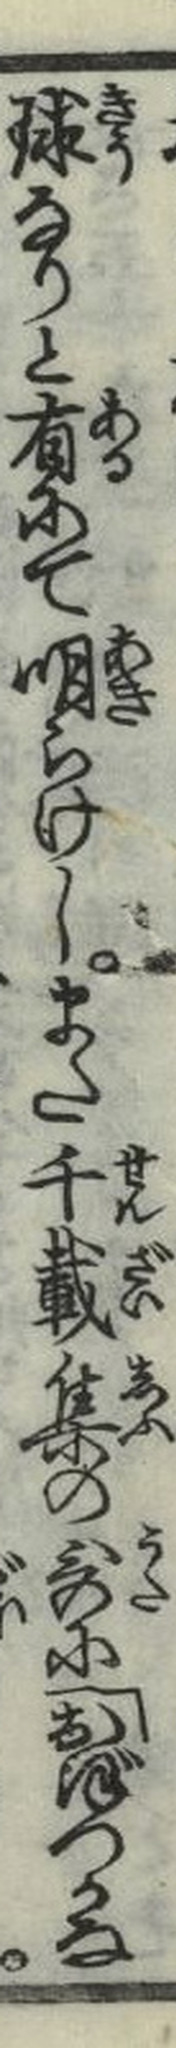球なりと有にて明らけし。また千載集の哥に〽おぼつかな
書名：琉球奇譚
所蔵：University of the Ryukyus Library
